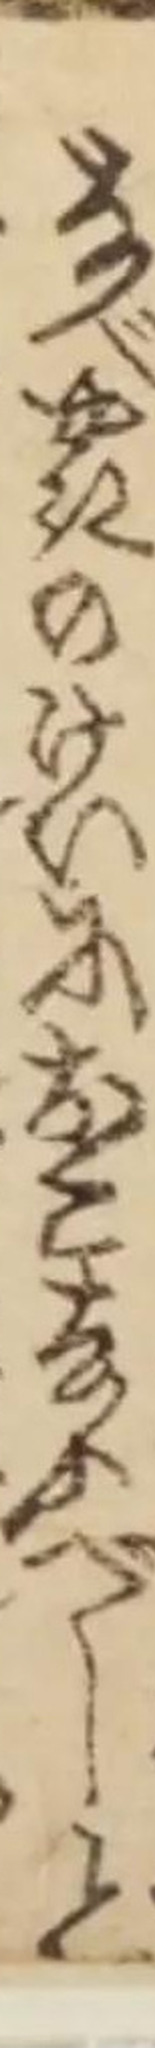なべやきのけいにおこなふべしと
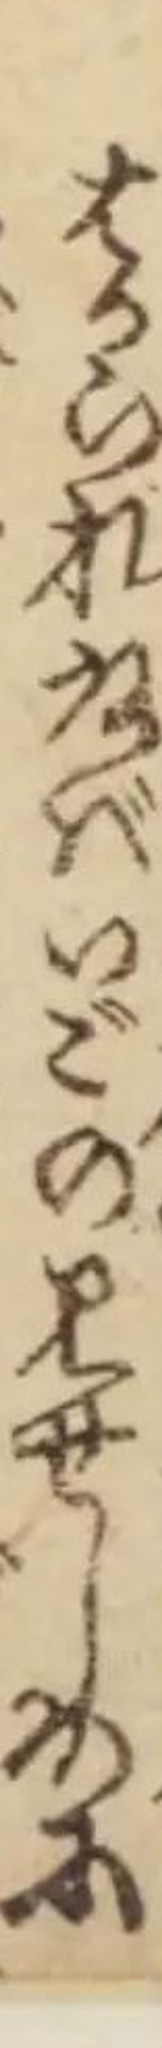はかられねばいごの見せしめに
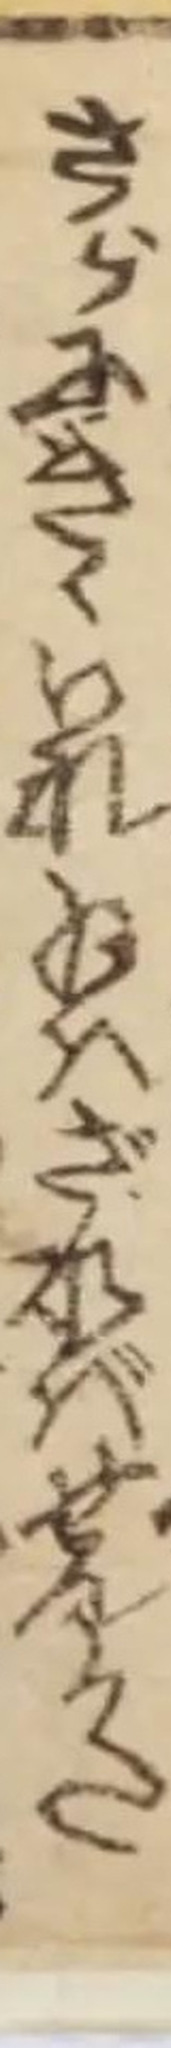さらにきゝいれねはざればせんせんかた
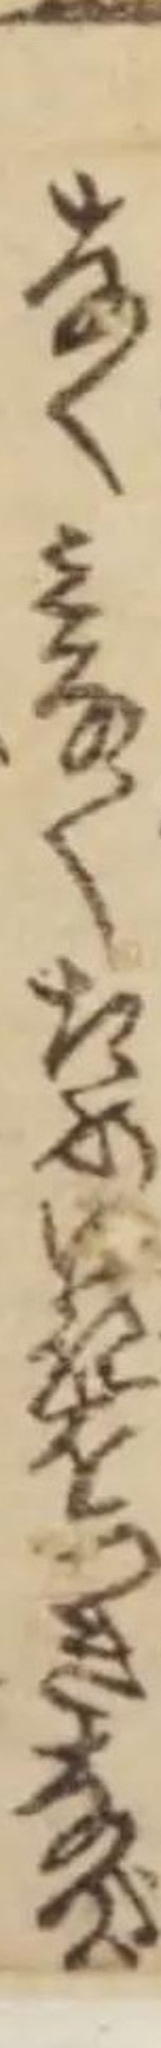なくみな〳〵ためいきをつきながら
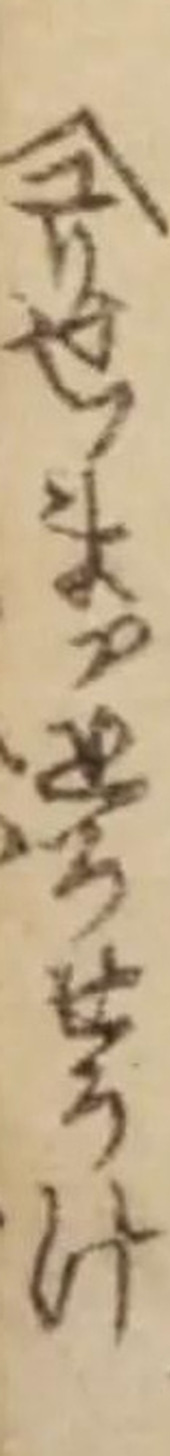「ゆりせまアとうせう汁
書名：生捕ました三度の大地震
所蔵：国立国会図書館 National Diet Library, JAPAN
